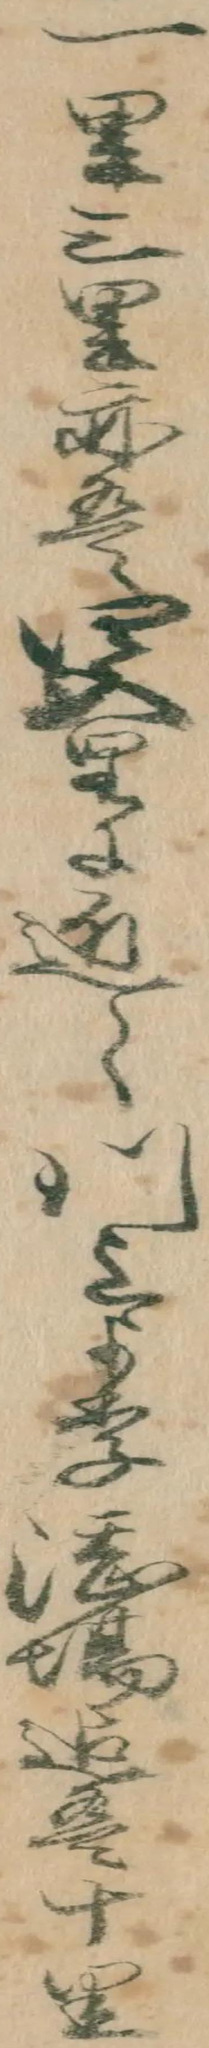二里三里亦は四五里に近く川上より湛場迄は十里
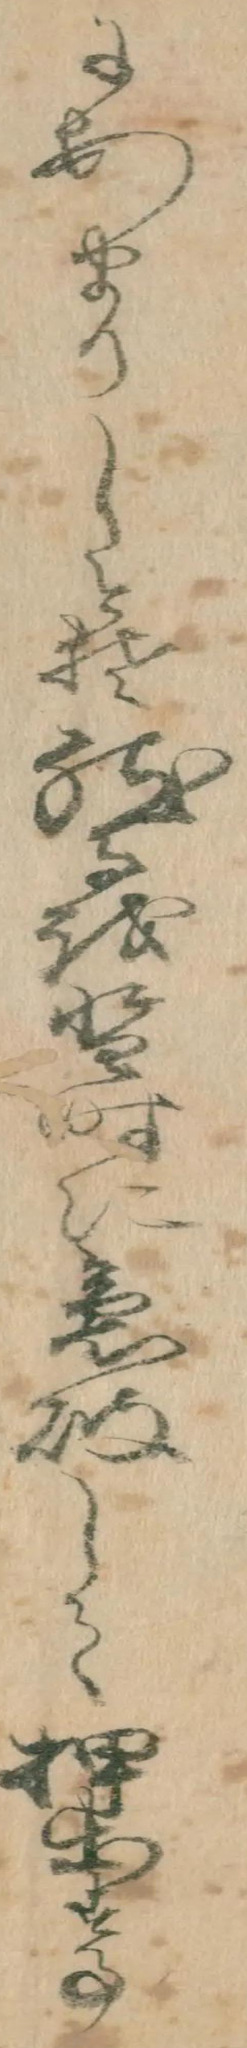にあまりしとそ然るを暫時に急破して押出す事
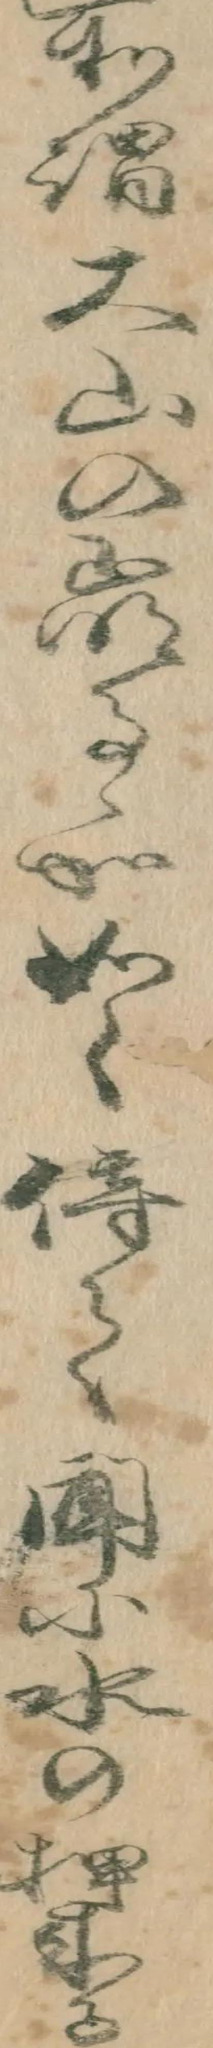所謂大山の崩るゝか如く侍て聞に水の押来る
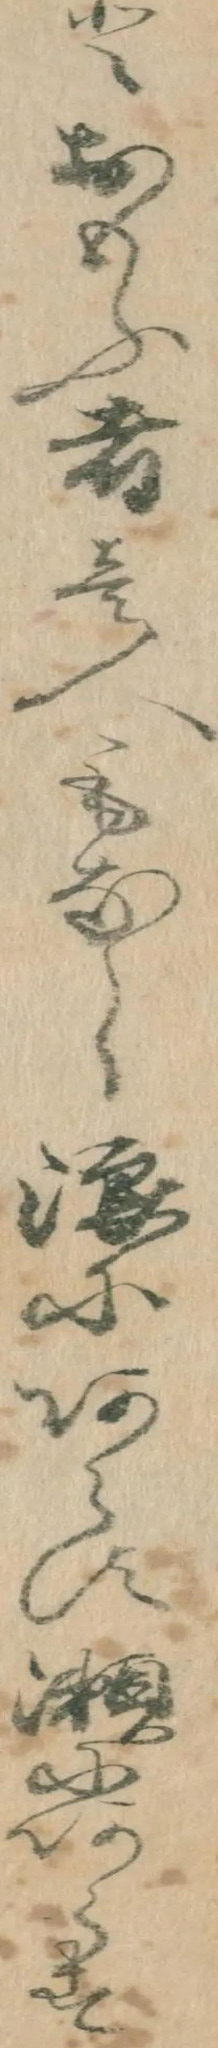とおもふ者壱人もなく浪にあらす瀬にあらす
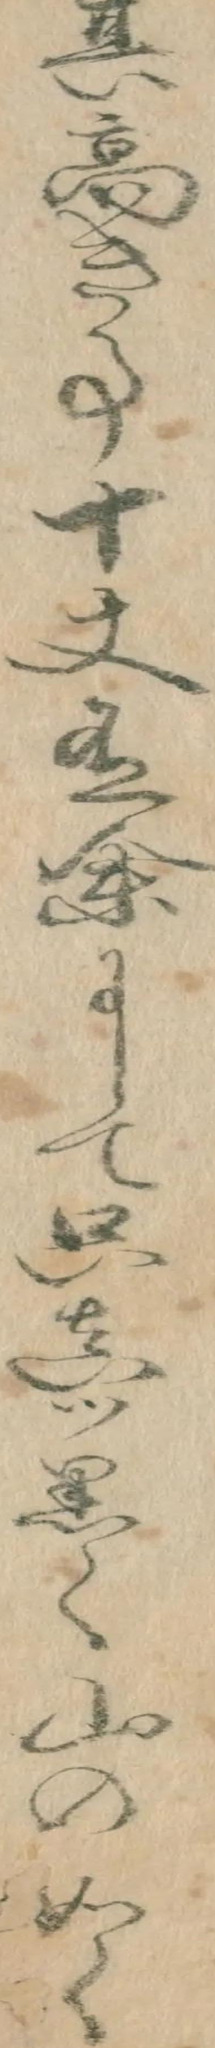其高き事十丈有余にして只真ツ黒く山の如く
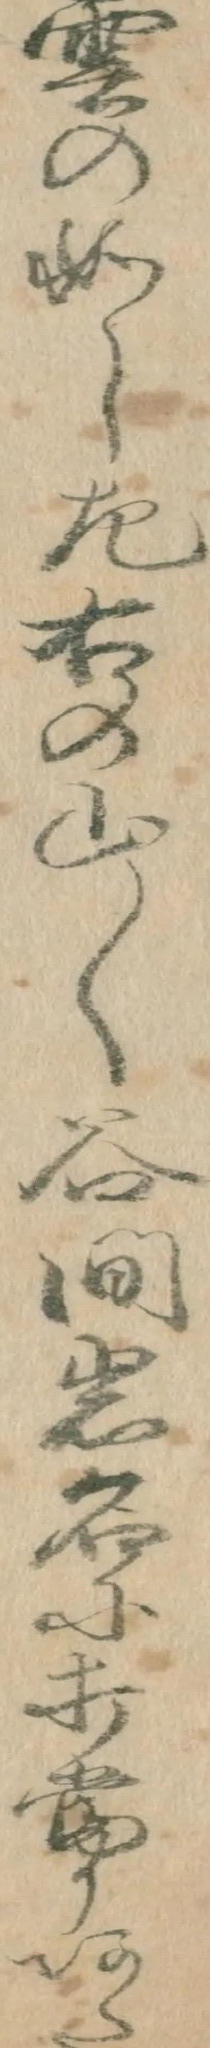雲の如し左右の山〳〵谷間岩名に打当りあた
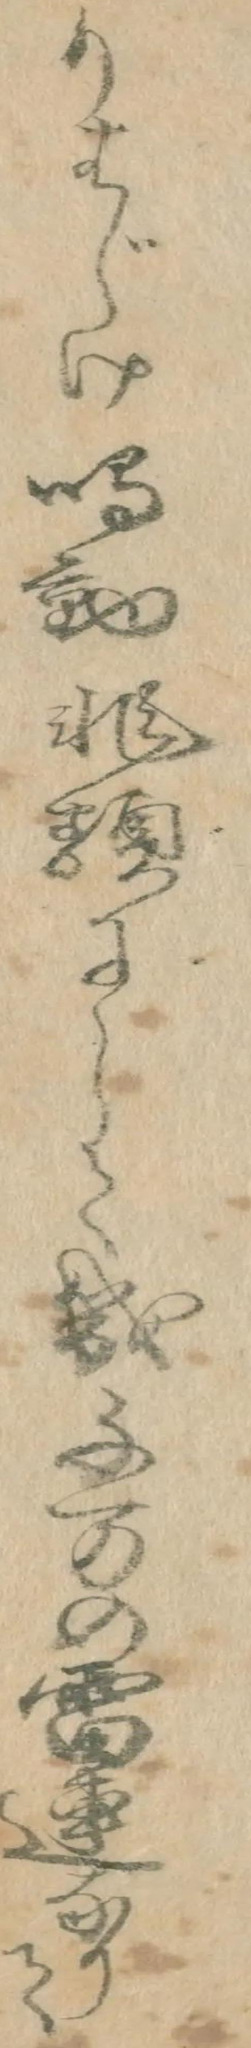りはじけ鳴動非類にして幾千万の雷連なりて
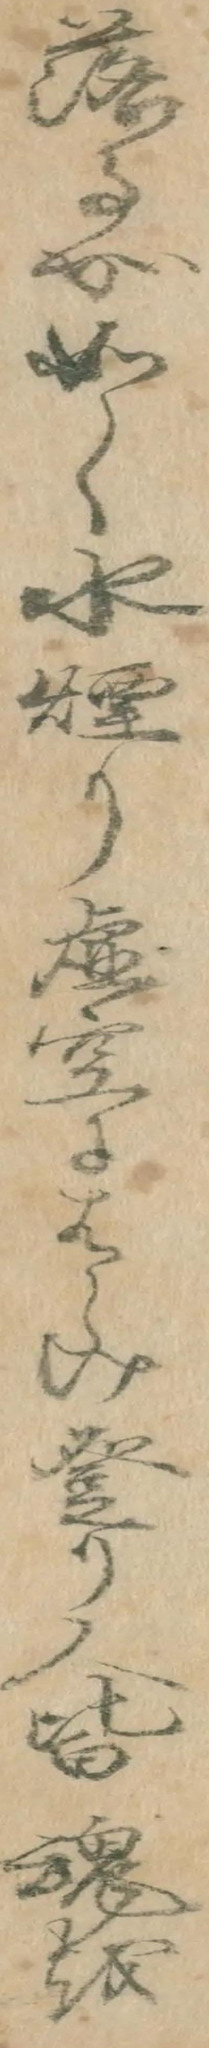落るか如く水煙り虚空にはしけ登り人皆魂を

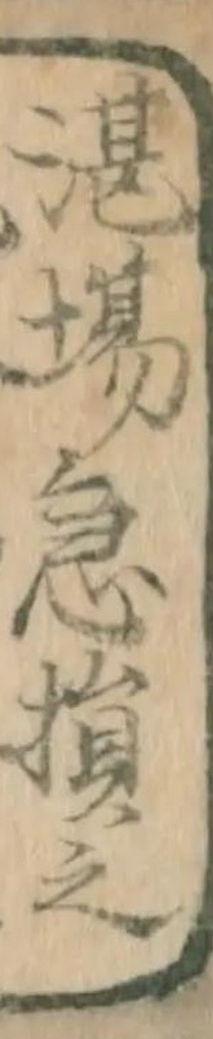湛場急損之
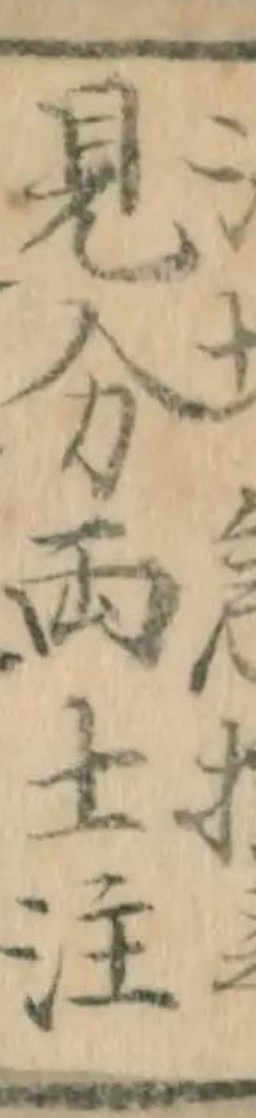見分両士注
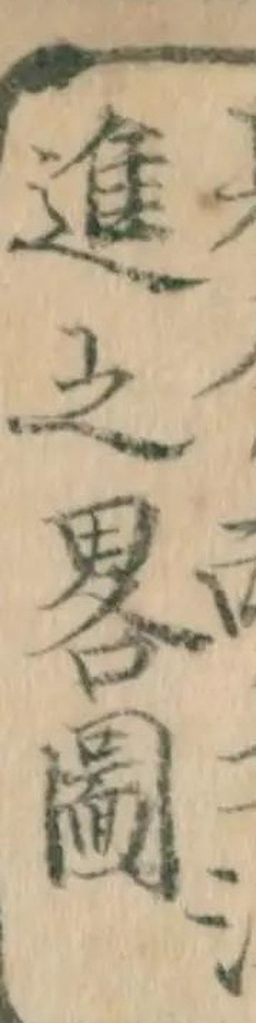進之略図

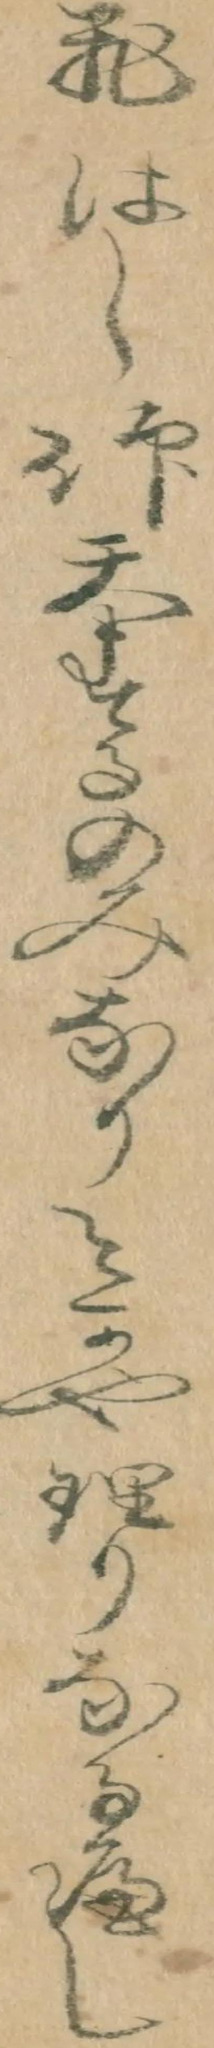飛はし仰天するのみなりとかや理りなるへし
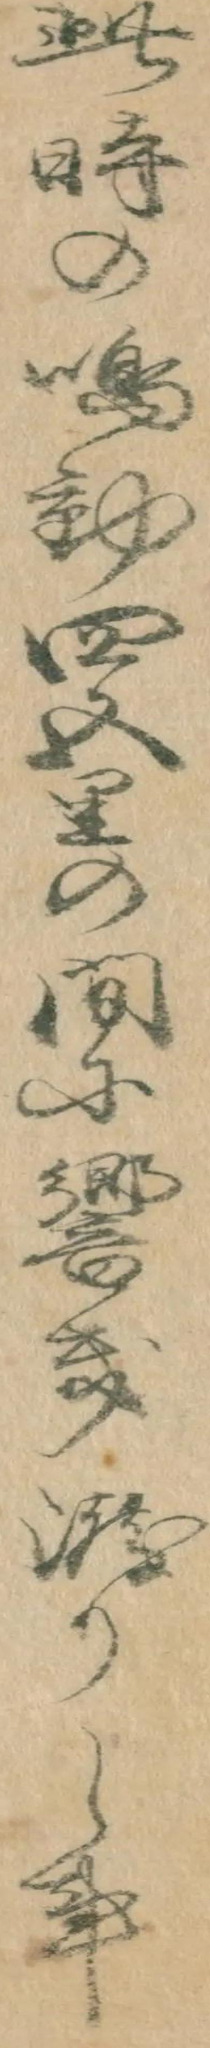此時の鳴動四五里の間に響き渡りし事
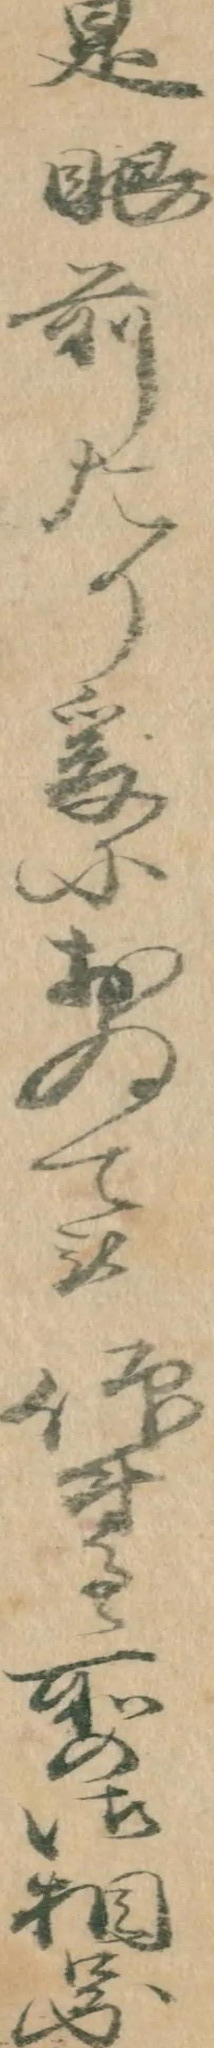是眼前たり爰におゐて被仰付るゝ所の御相図
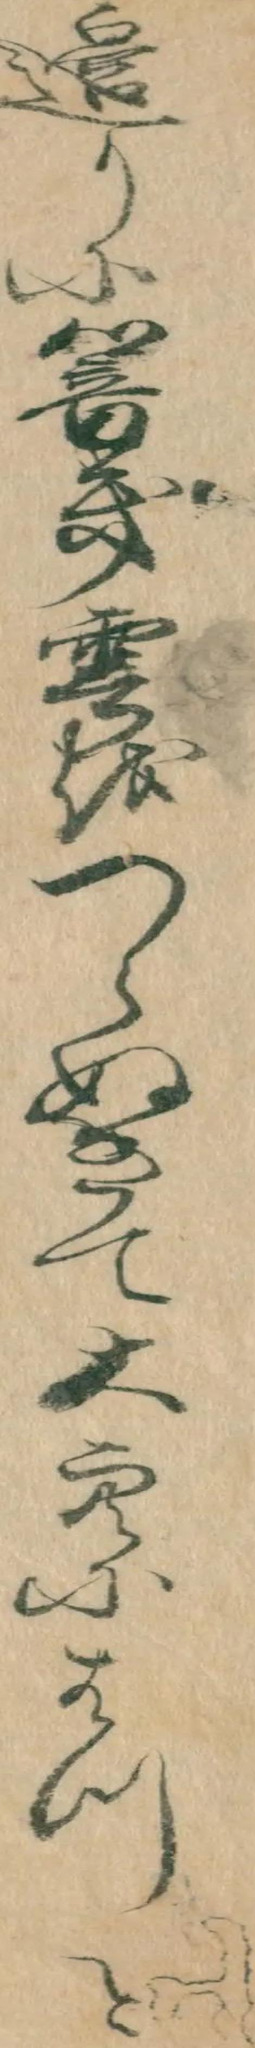辺りに響き雲をつらぬきて大空にはつと
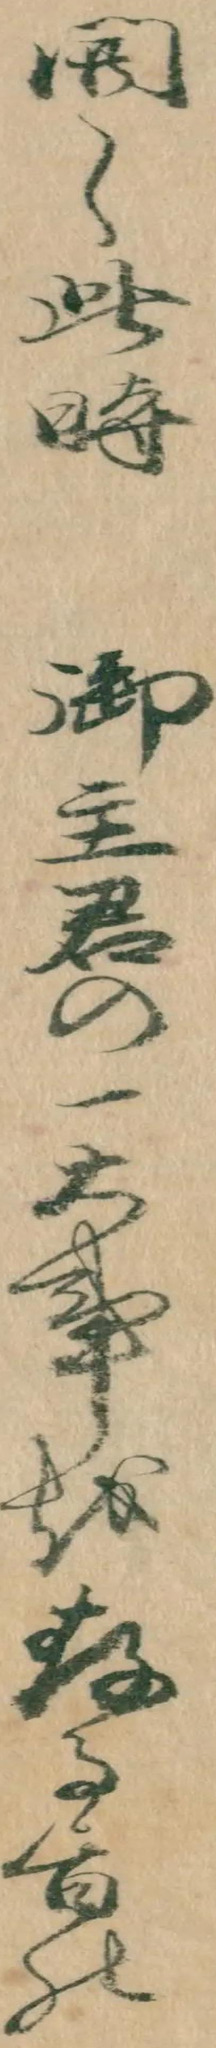開く此時御主君の一大事を存る旨の
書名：俗語之種. [6]
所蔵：国立国会図書館 National Diet Library, JAPAN
